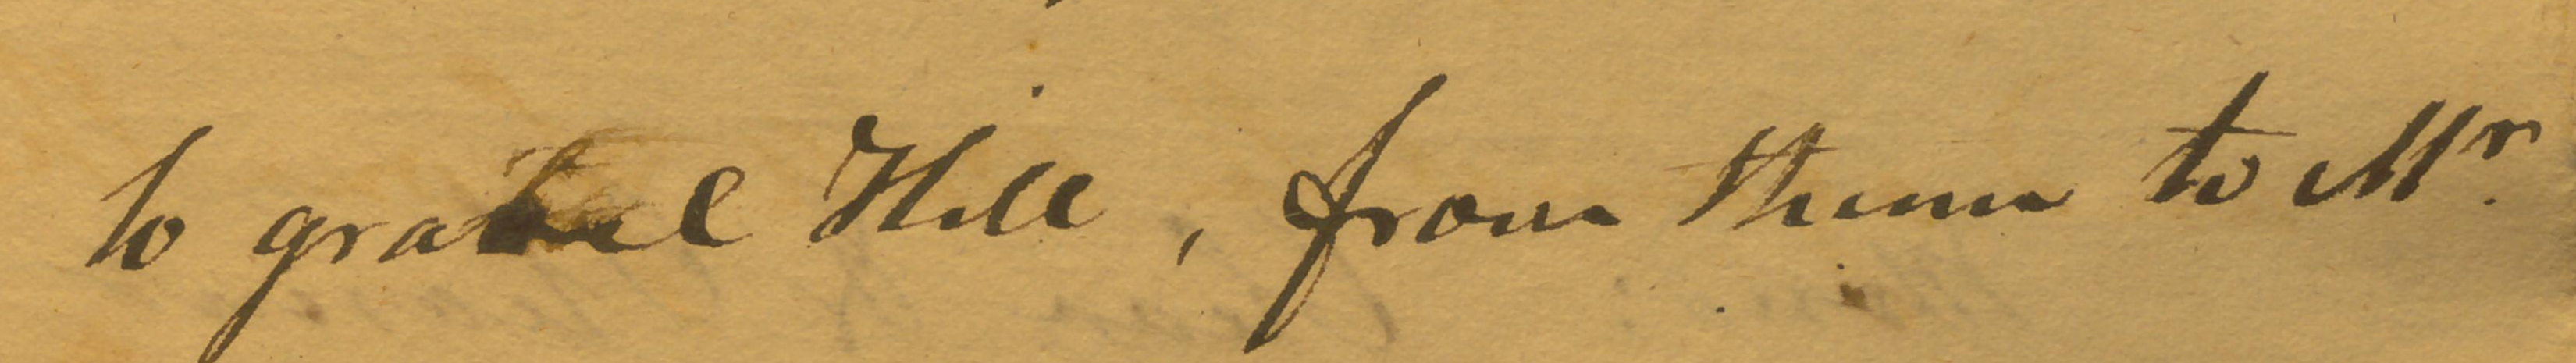to gravel Hill, from thence to M^r.
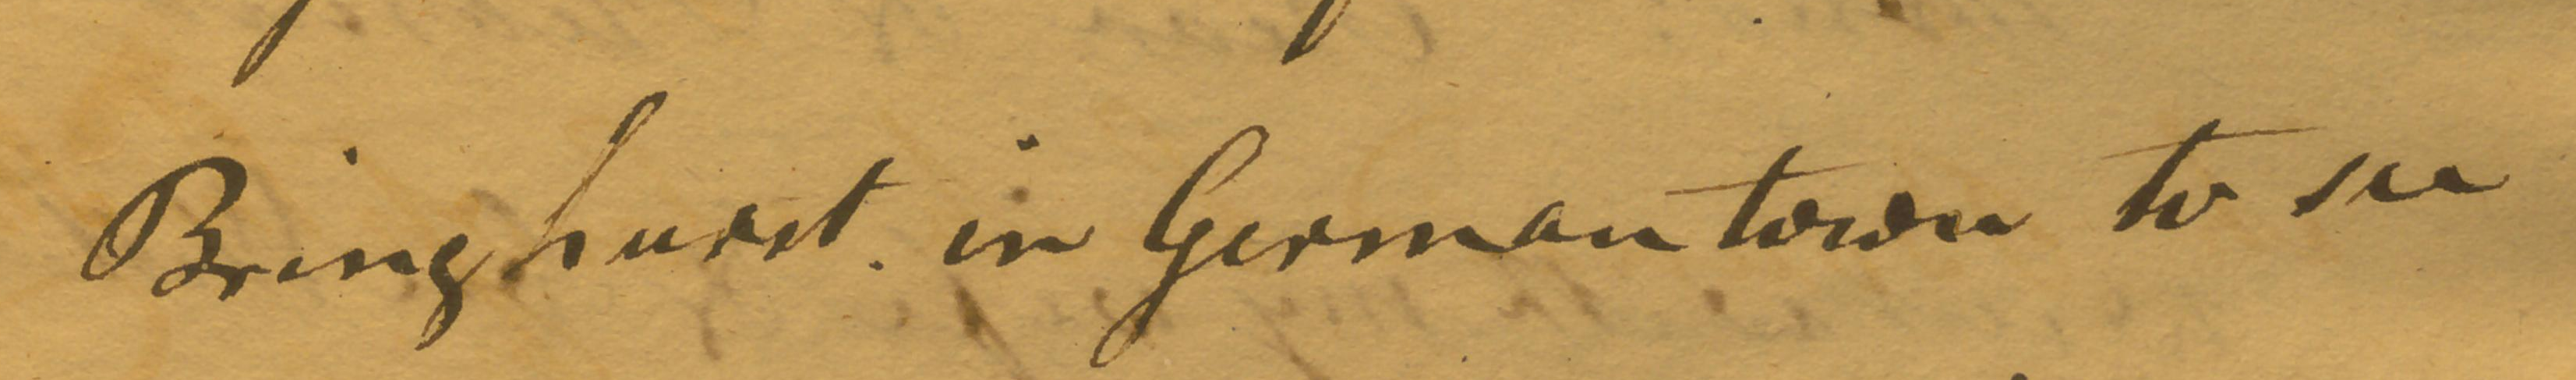Bringhurst in Germantown to see
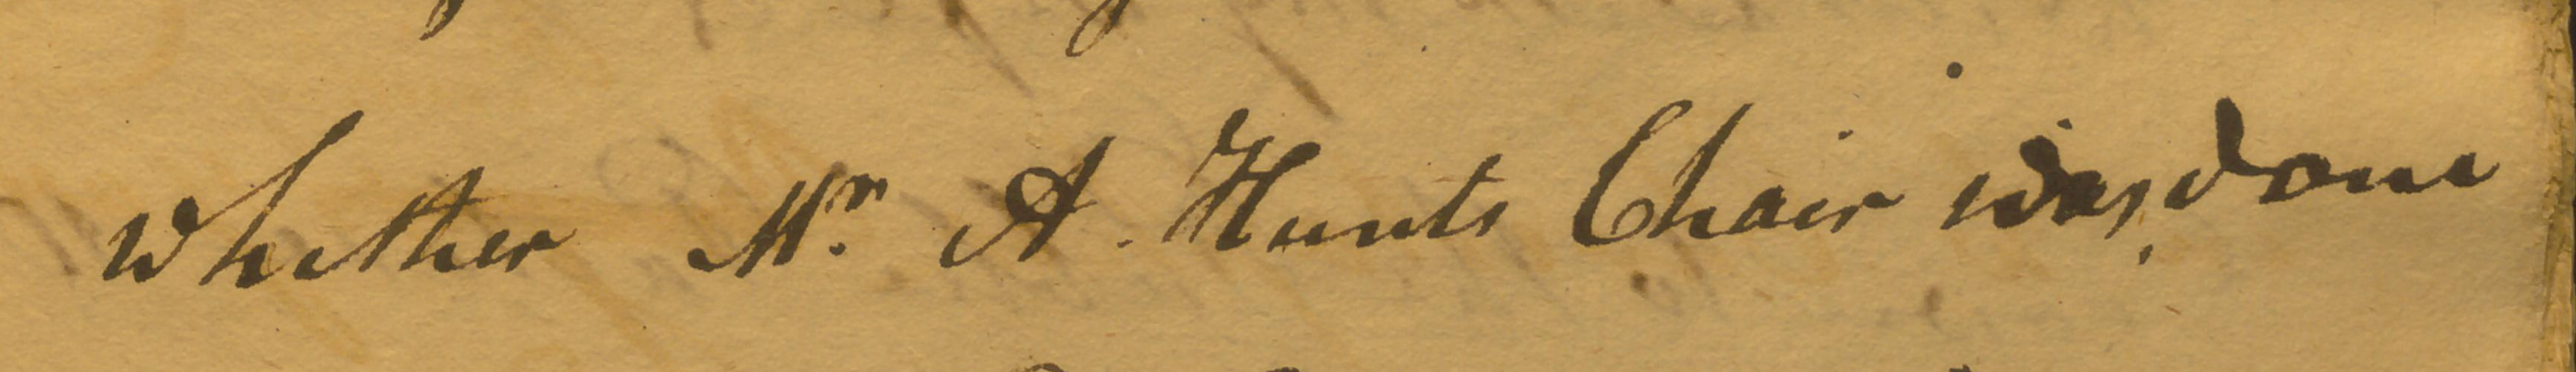whether M^r. A Hunts Chair was done
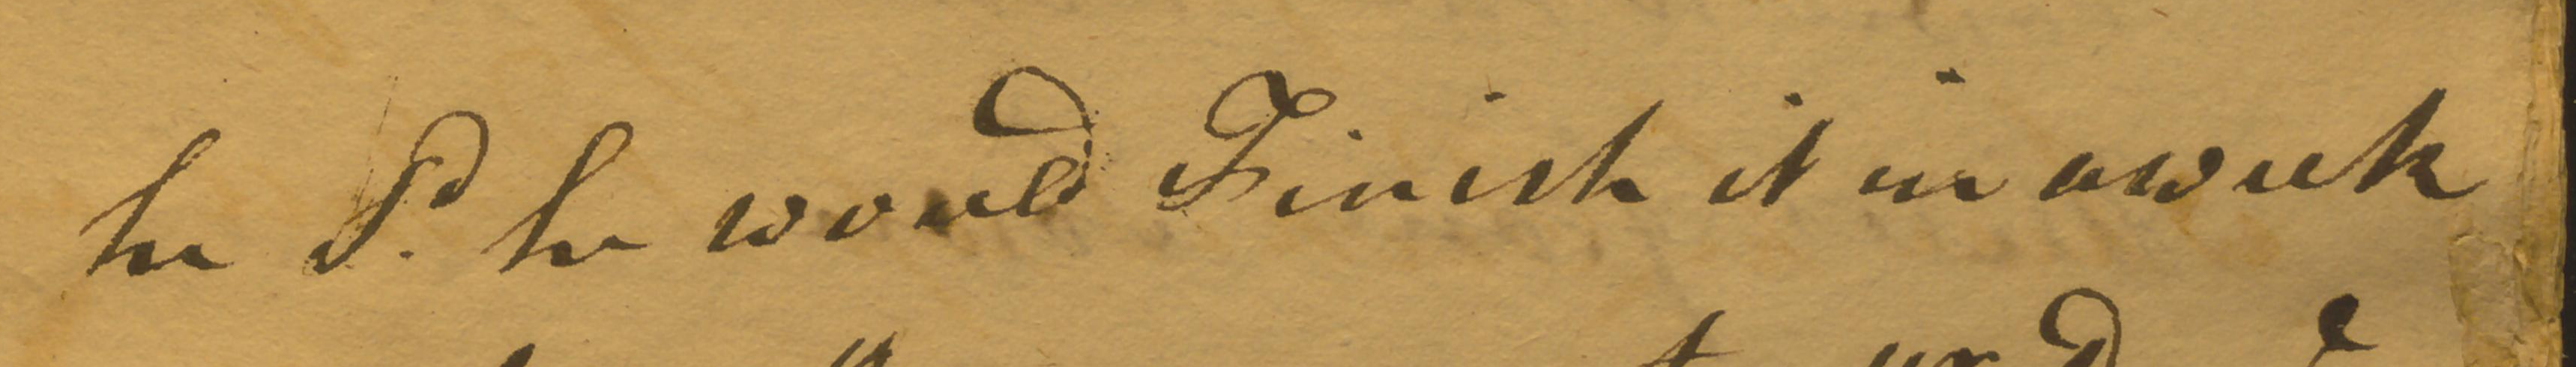he s^d. In would Finish it in a week
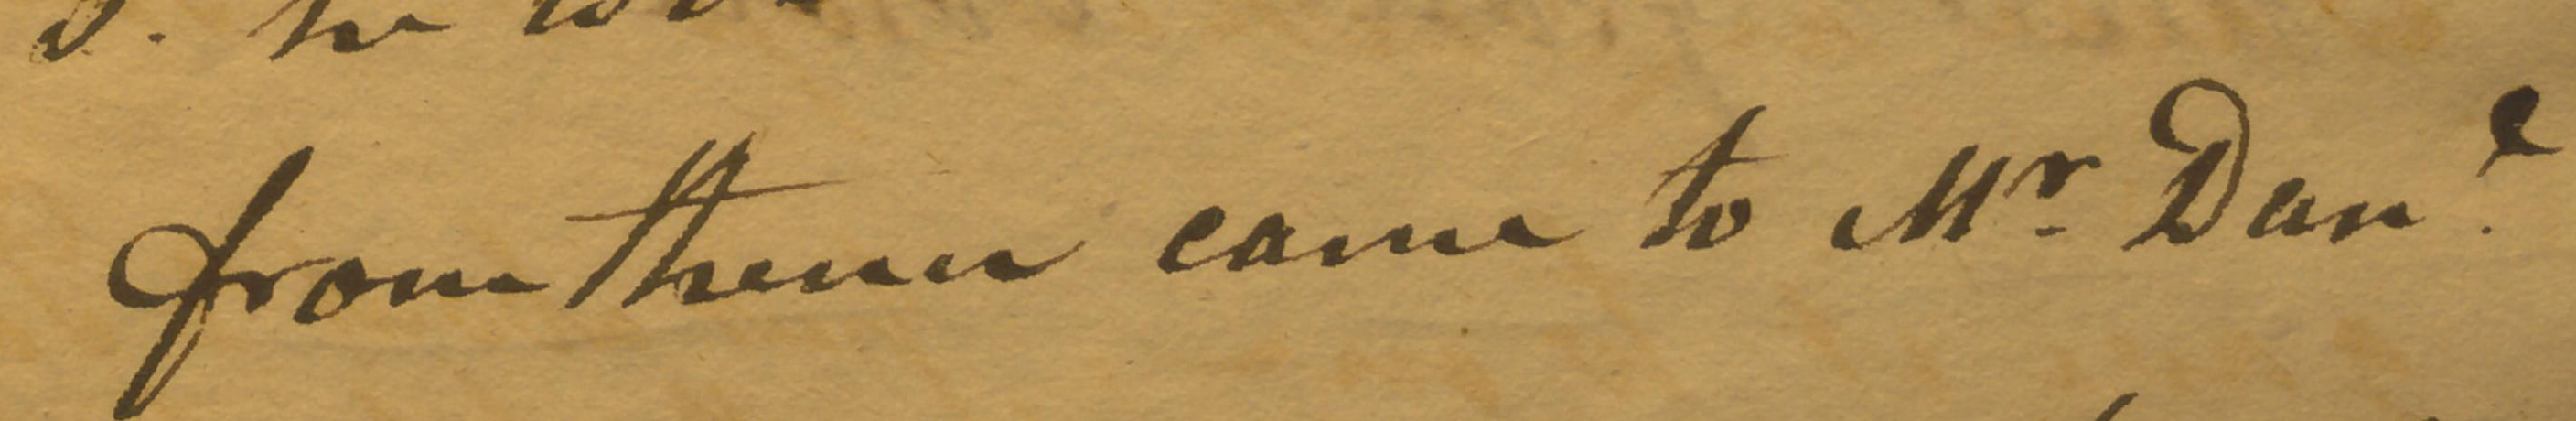from thence came to M^r. Dan^l.
